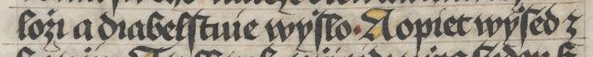loži a dialelſtuíe wyẛlo.A opiet wyẛed z
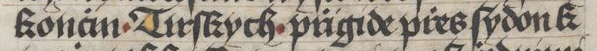koċin.Tirſkych.pṙigide pṙes ſydon k
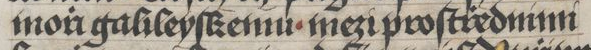moṙi galileyſkemu.mezi proſtṙednimi
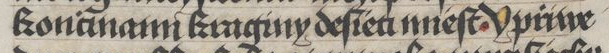konċinami kraginy deſieti míeſt.Y pṙiwe¬
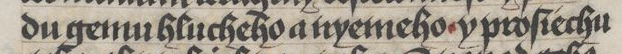du gemu hlucheho a nyemeho.y proſíechu
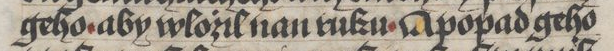geho.aby wlożil nan ruku.A popad geho
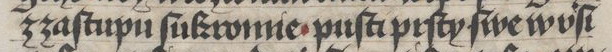z zaſtupu ſukromie.puſti prſty ſwe w vẛi
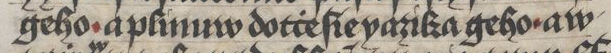geho.a plinuw dotċe ſie yazika geho.a w¬
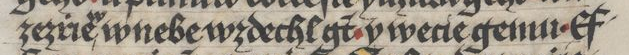zezṙiew wnebe wzdechl ḡt y wecie gemu. Ef¬
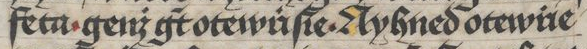feta.genż ḡt otewṙi ſie. A yhned otewṙie¬
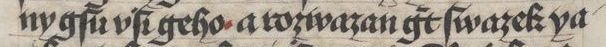ny gſu vẛi geho.a rozwazan ḡt ſwazek ya¬
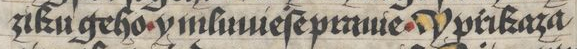ziku geho.y mluuieẛe prauie.Y pṙikaza
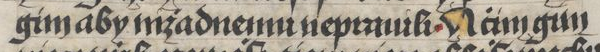gím aby niżadnemu neprauili.A ċim gím
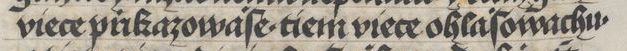víece pṙikazowaẛe.tiem víece ohlaẛowachu.
